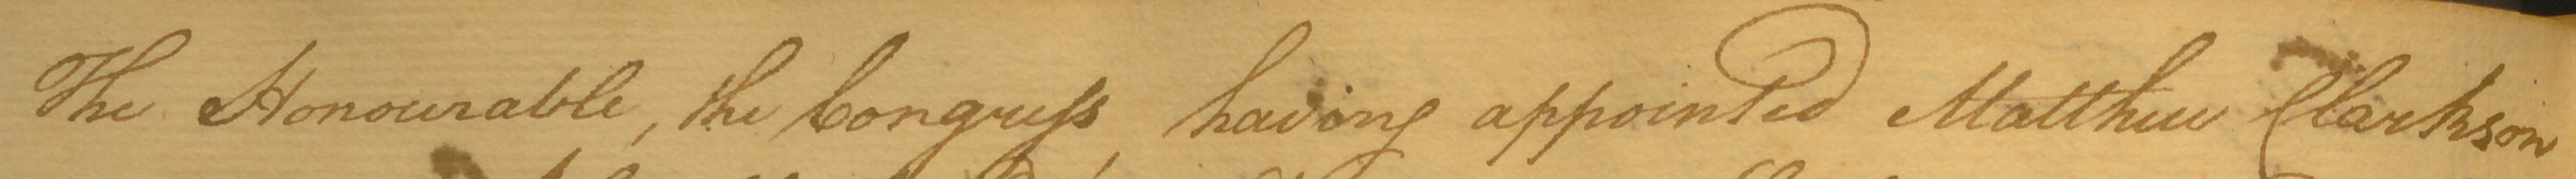The Honourable, the Congress, having appointed Matthew Clarkson
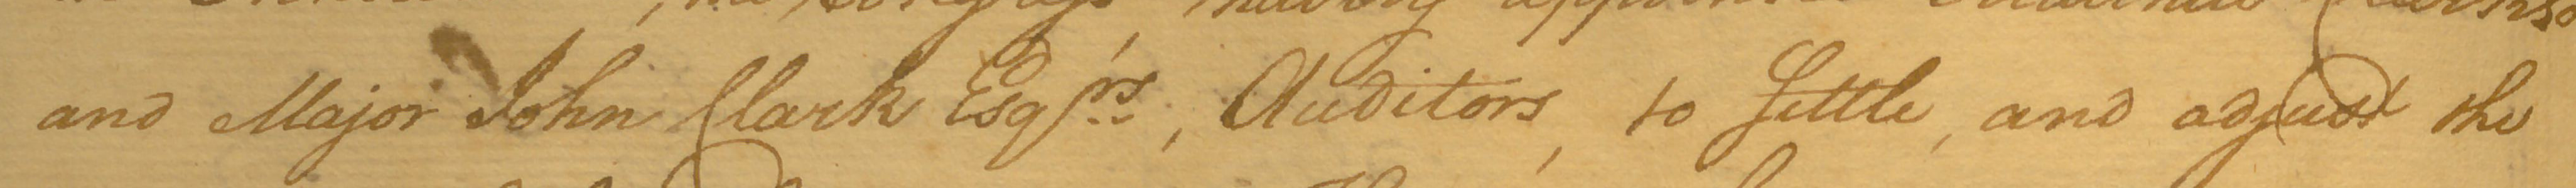and Major John Clark Esq^rs., Auditors, to settle and adjust the
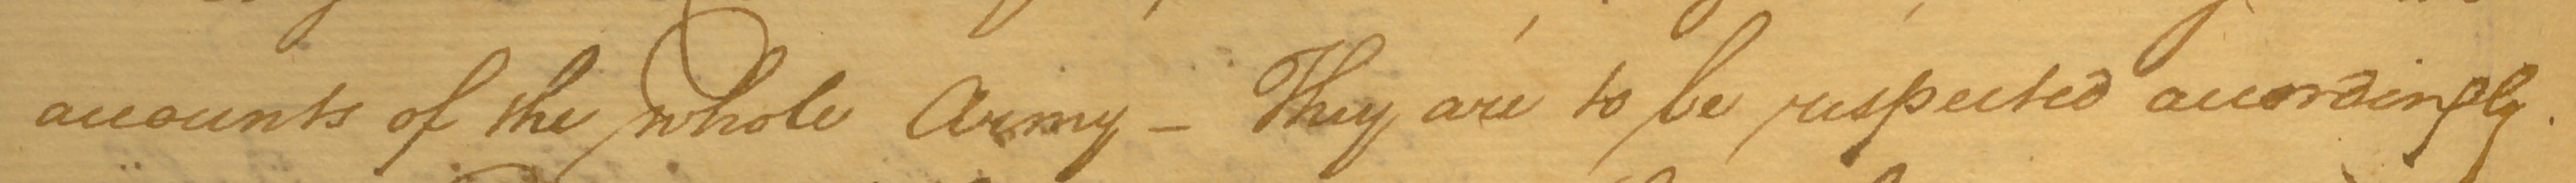accounts of the whole Army- They are to be respected accordingly
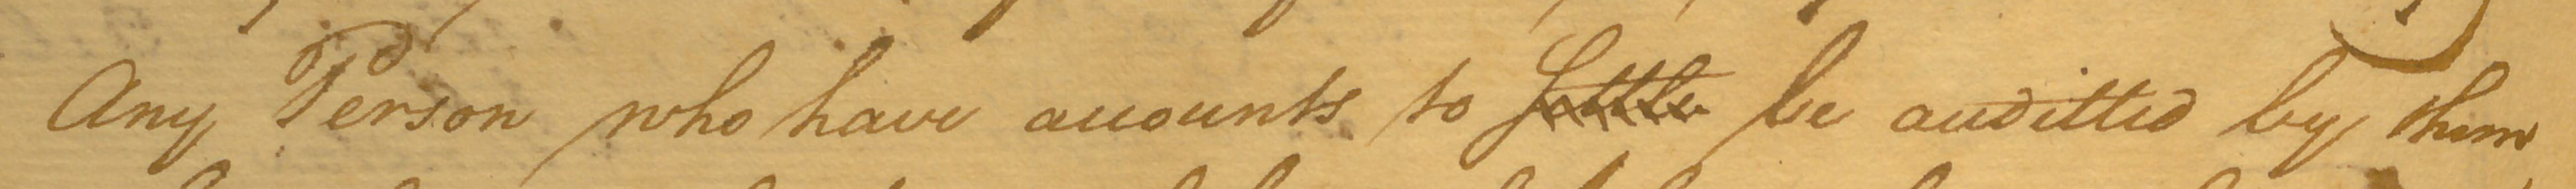Any Person who have accounts to settle be auditted by them
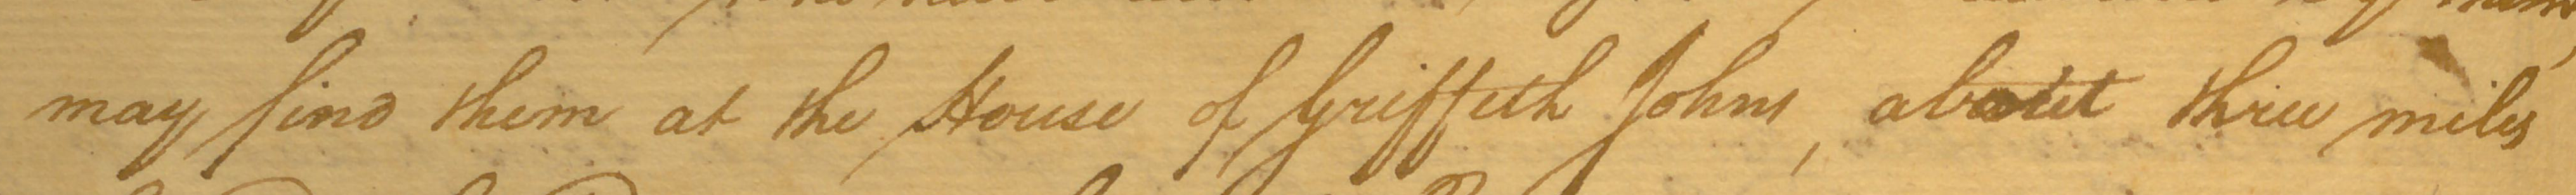may find them at the House of Griffith Johns, about three miles
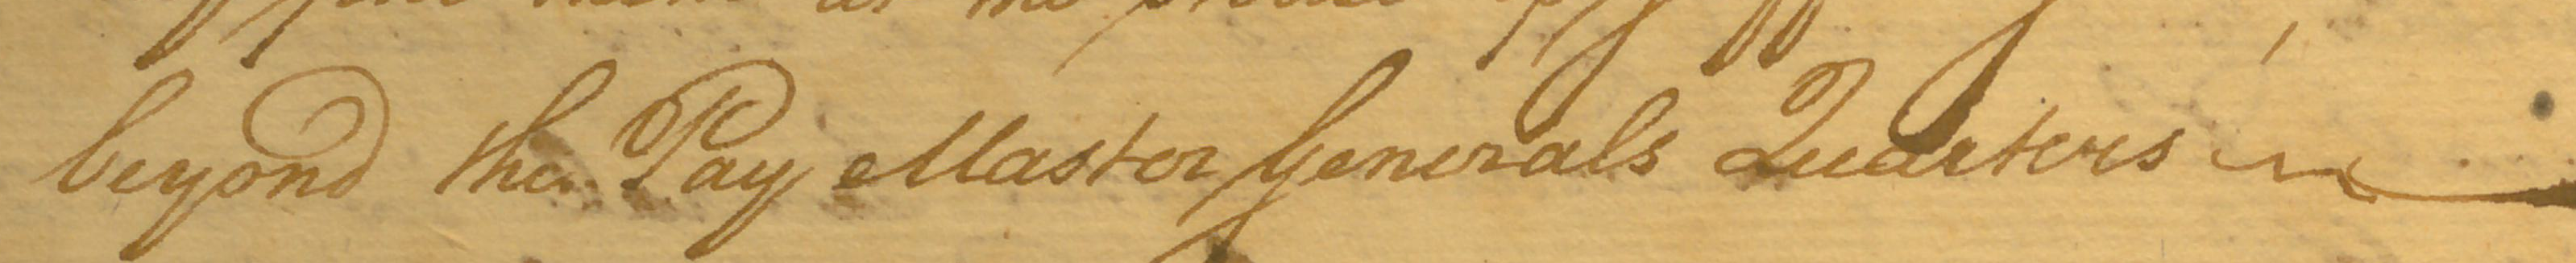beyond the Pay Master General Quarters-
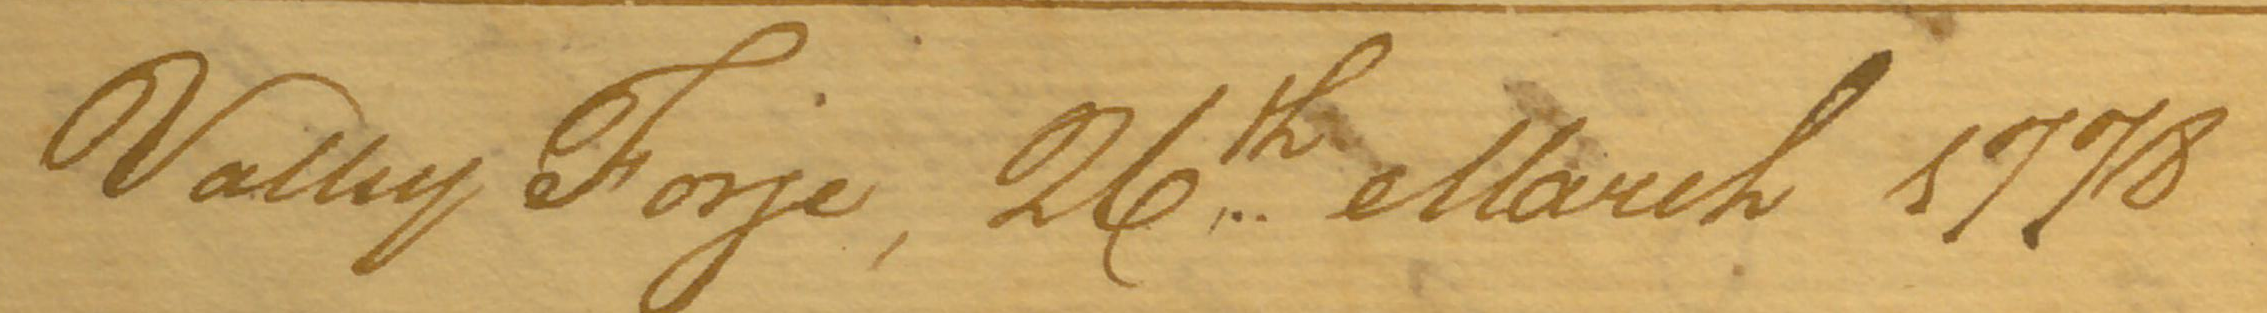Valley Forge, 26^th. March 1778
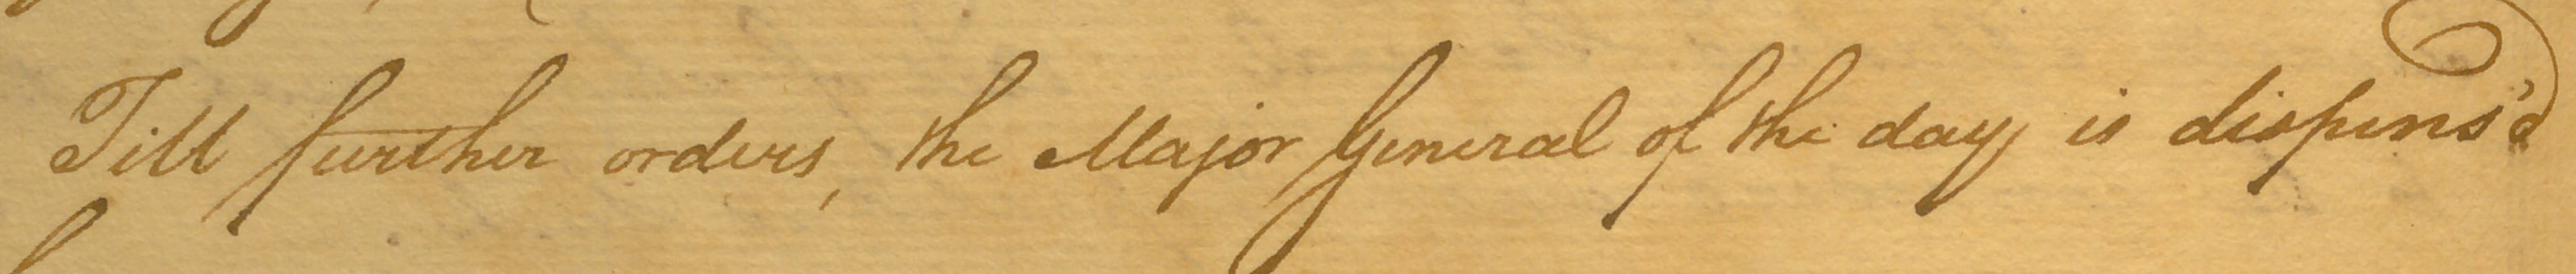Till further orders, the Major General of the day is dispens'd
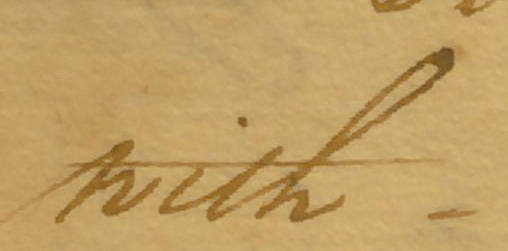with.
